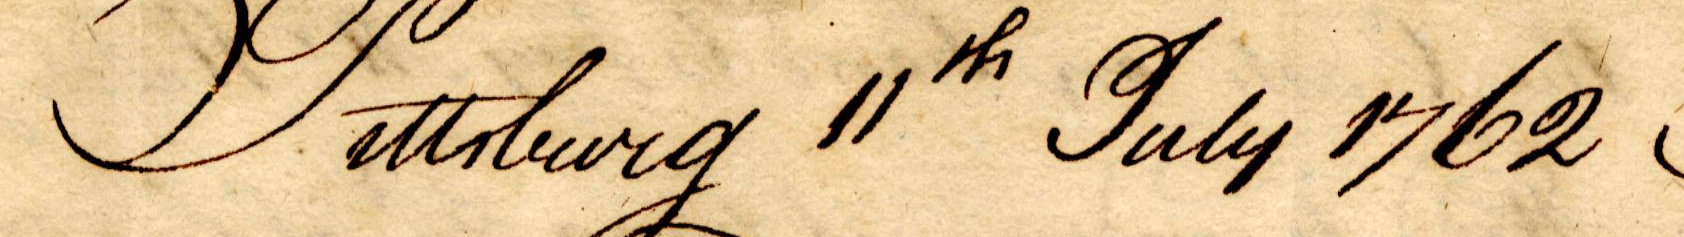Pittsburg 11^th July 1762
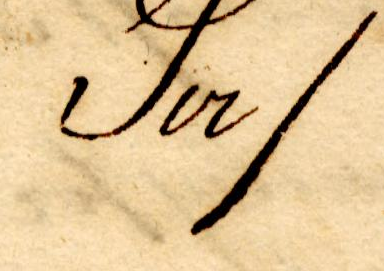Sir,
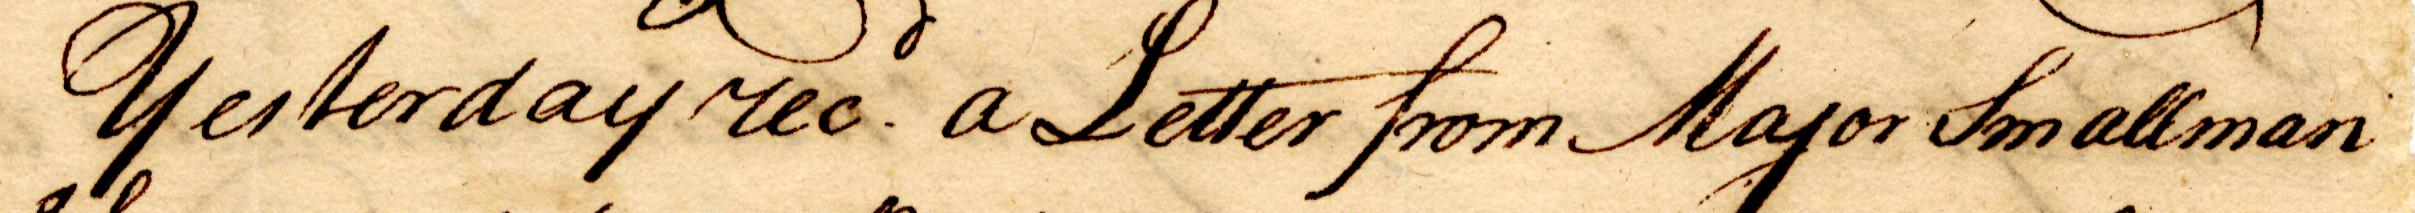Yesterday rec.^d a Letter from Major Smallman
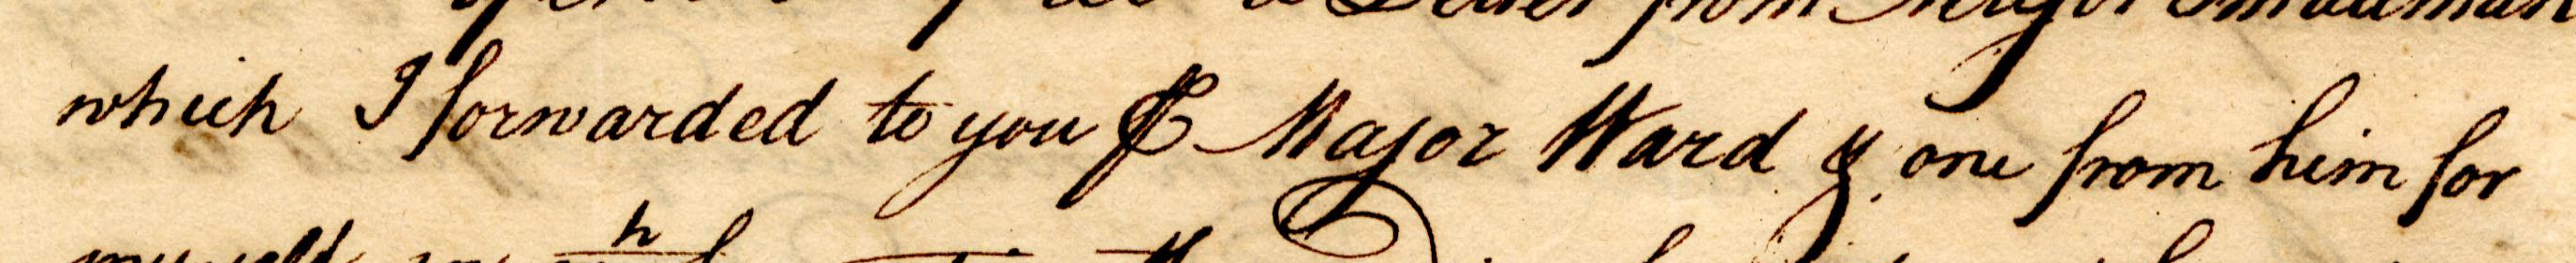which I forwarded to you & Major Ward & one from him for
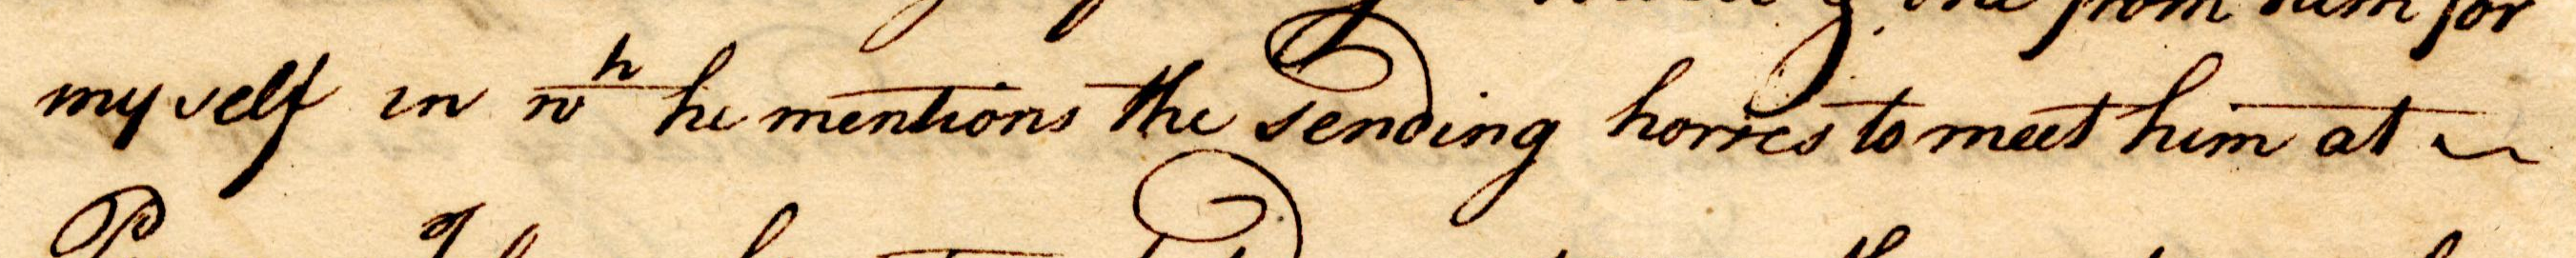myself in w^h he mentions the sending horses to meet him at
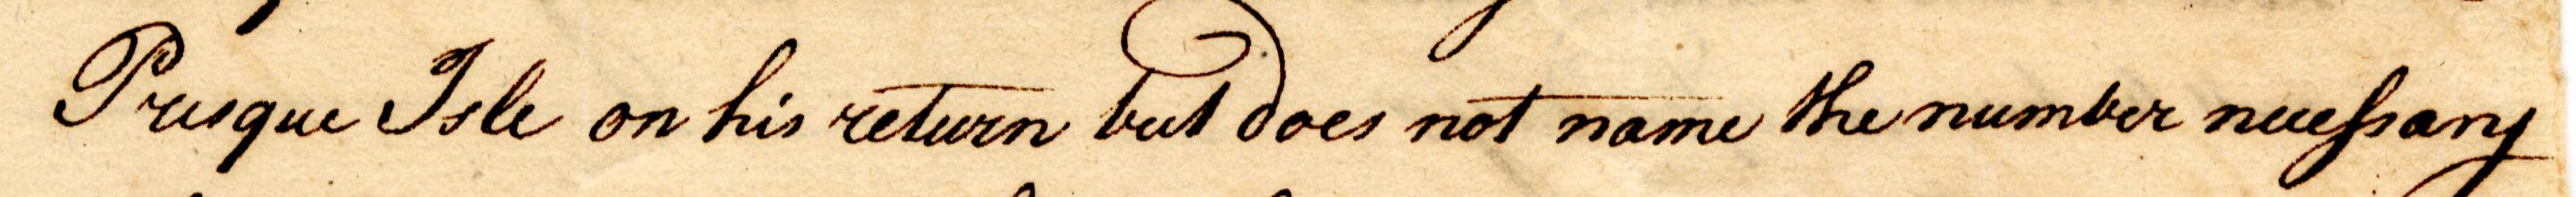Presque Isle on his return but does not name the number necessary
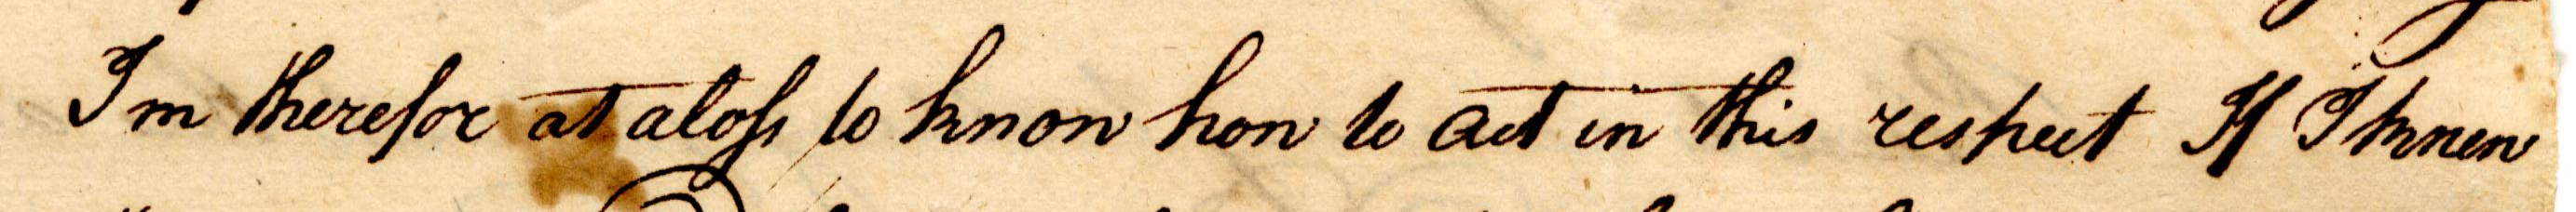Im therefore at aloss to know how to act in this respect If I knew
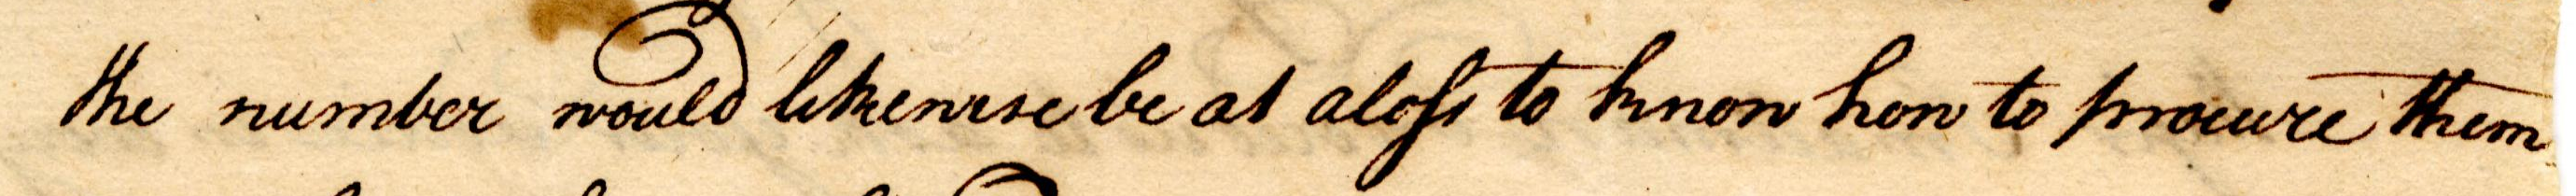the number would likewise be at aloss to know how to procure them
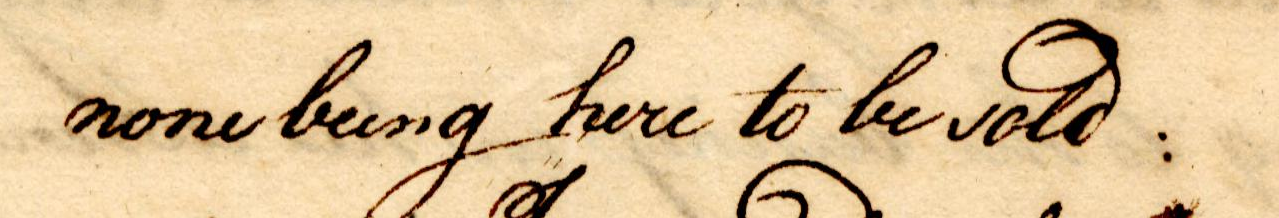none being here to be sold.
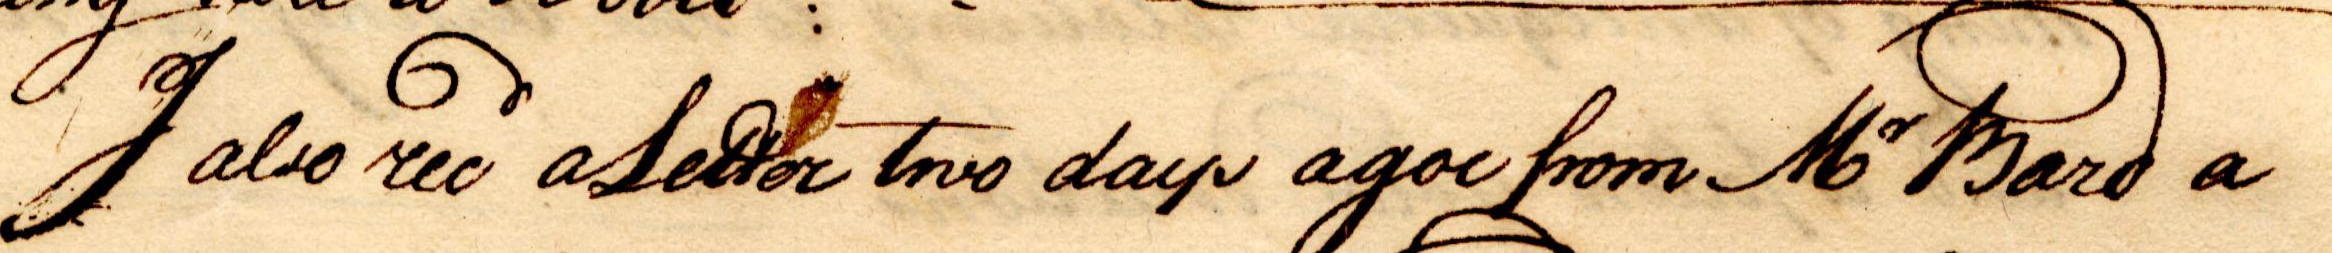I also rec^d a Letter two days ago from M^r Bard a
